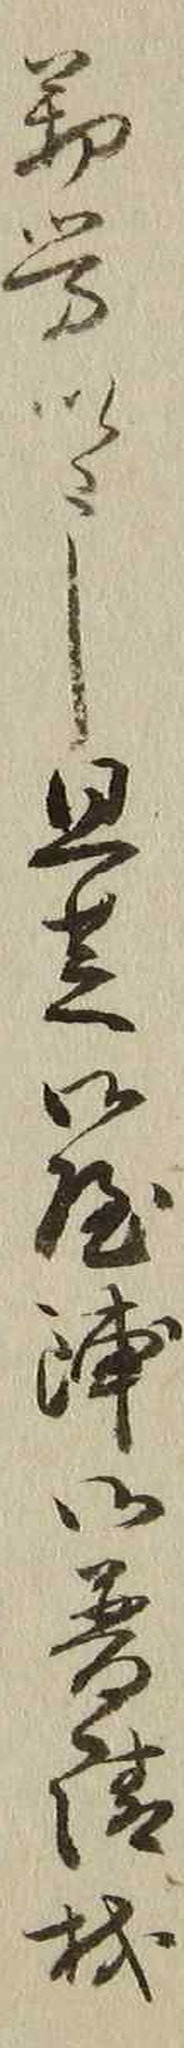勤労いたし且芝御屋鋪御普請材
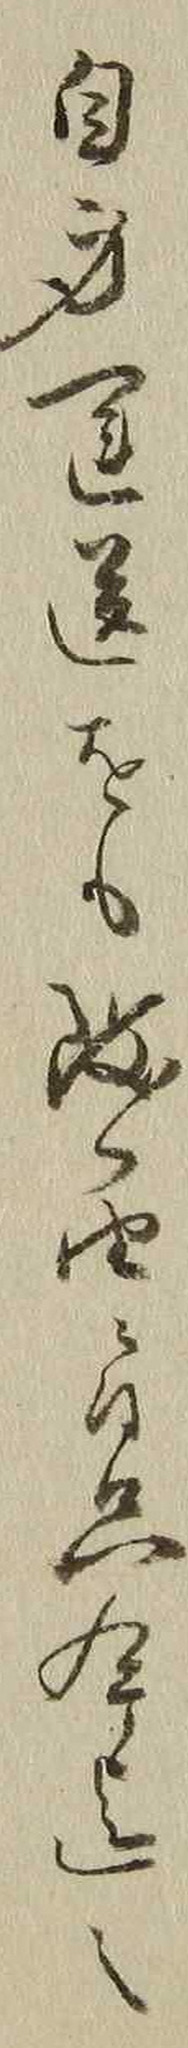自身運送をも致候由ニ付只今迄之
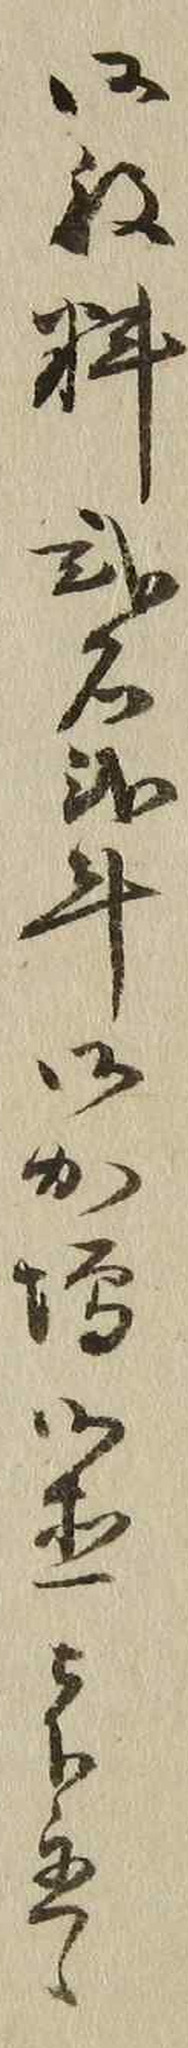御役料弐石弐斗御加増御直被下置候
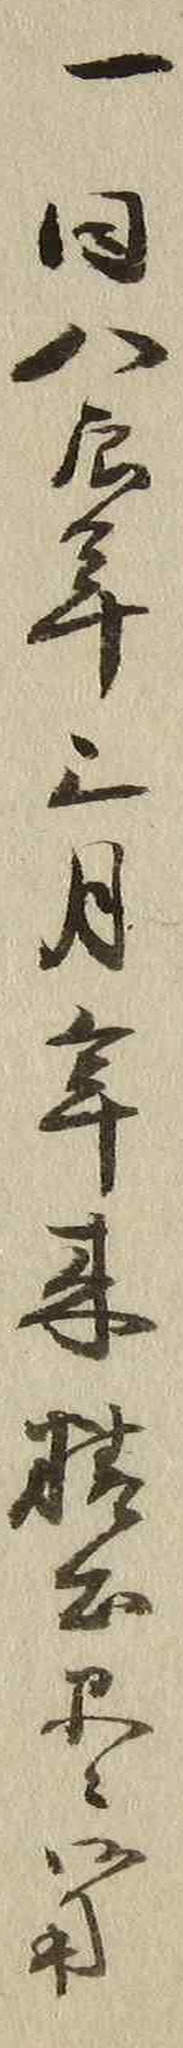一同八辰年三月年来精出品々御用
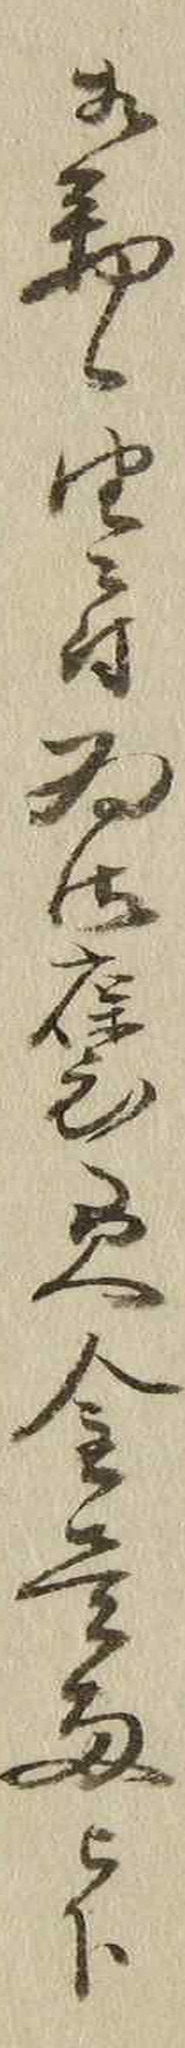相勤候由ニ付為御褒美金壱両被下
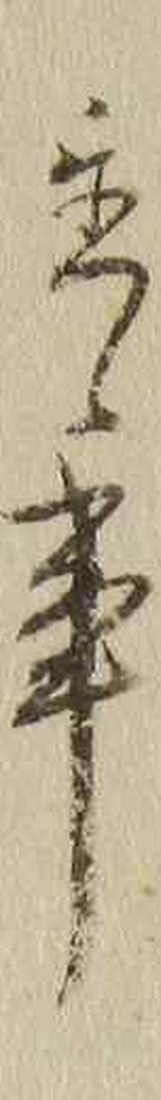置候事
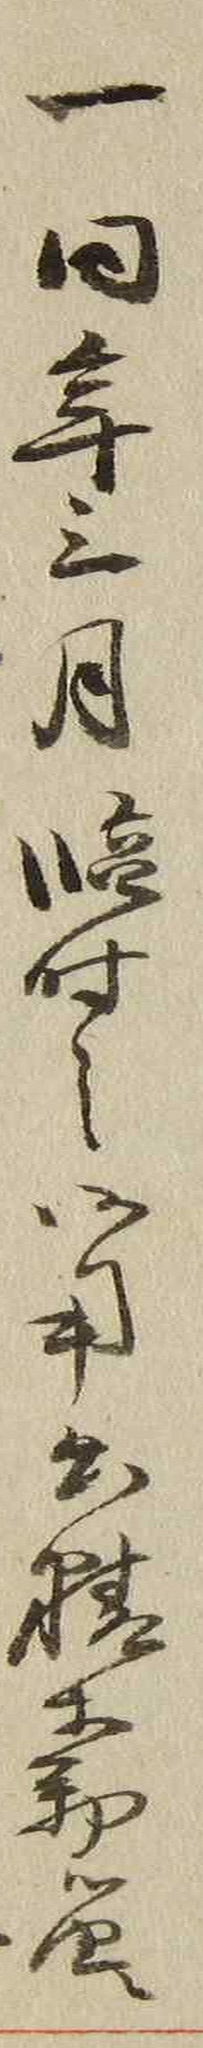一同年三月臨時之御用出精相勤候由ニ
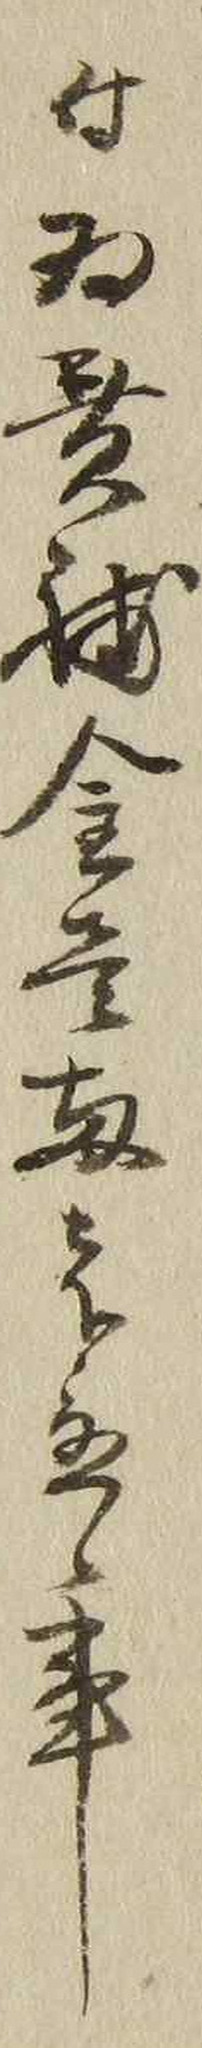付為費補金壱両被下置候事
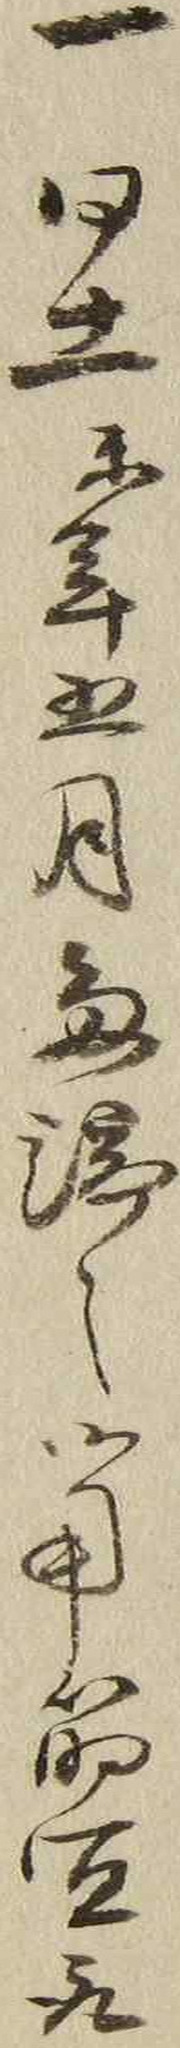一同十一未年五月多端之御用筋宜取
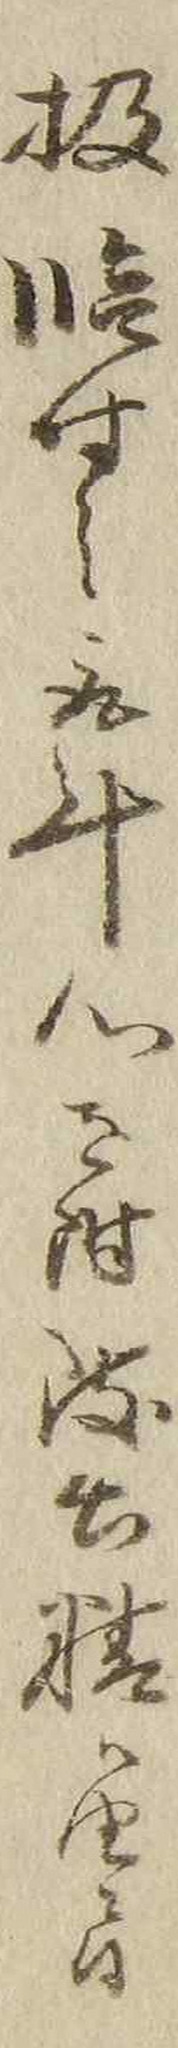扱臨時之取計心を附致出精候由ニ付
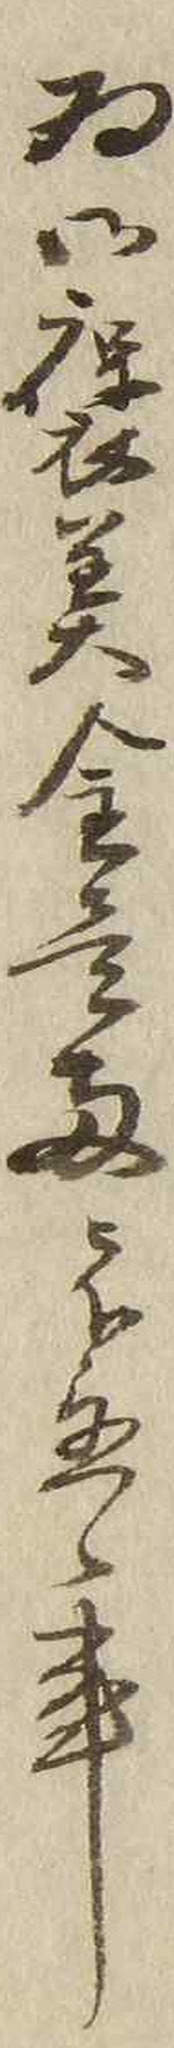為御褒美金壱両被下置候事

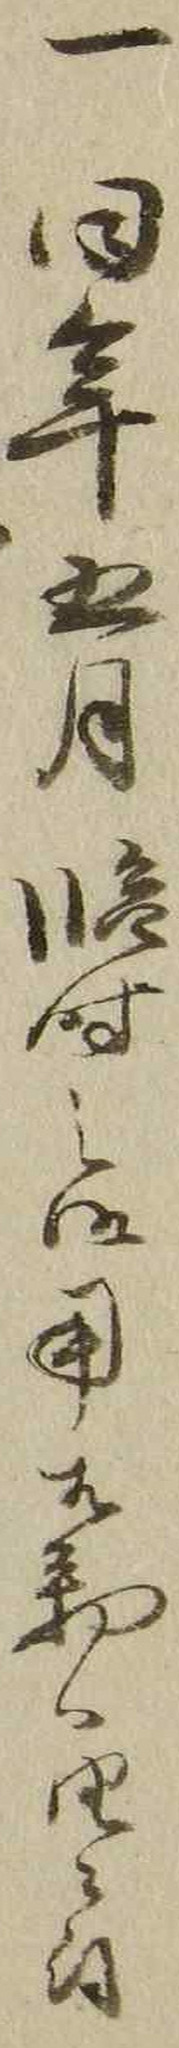一同年五月臨時之御用相勤候由ニ付
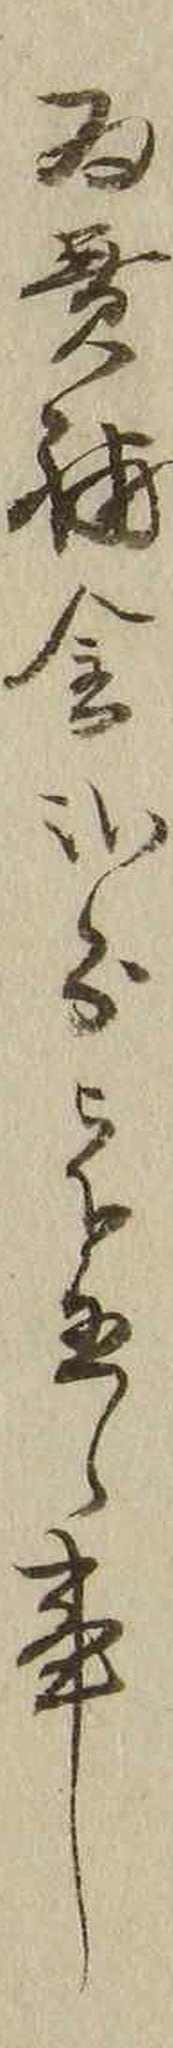為費補金弐分被下置候事
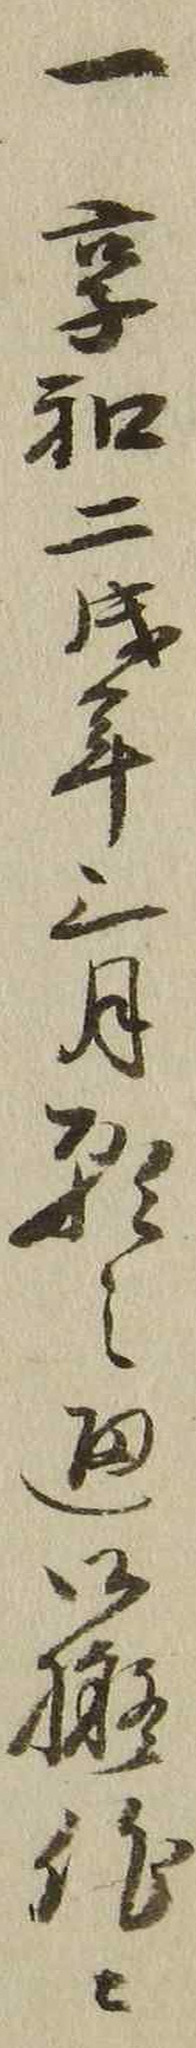一享和二戌年三月願之通御擬作被
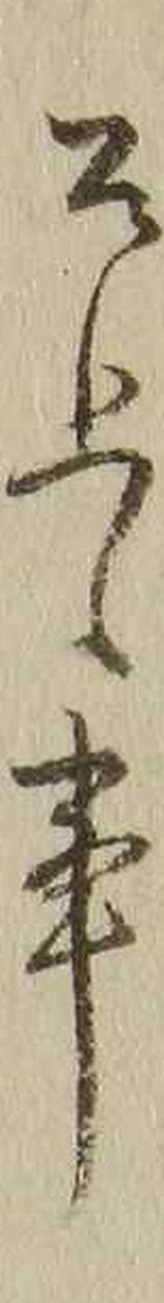召上候事
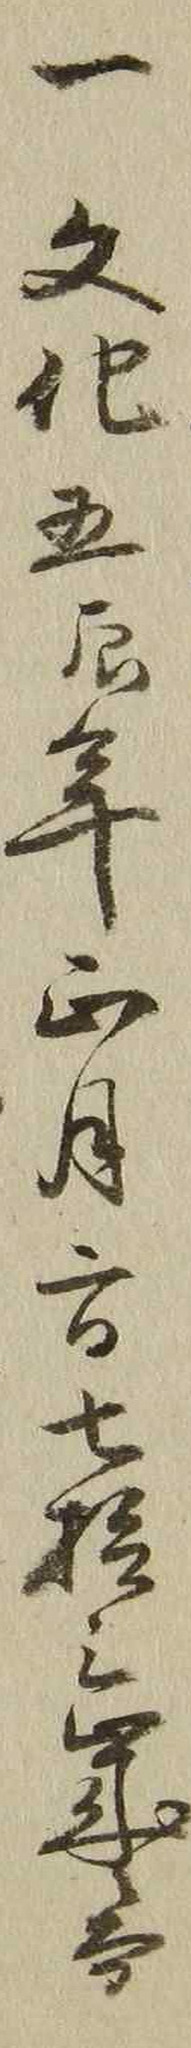一文化五辰年正月二日七拾三歳ニ而
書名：諸士系譜　巻之236　ふ之部4
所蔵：会津若松市立会津図書館
